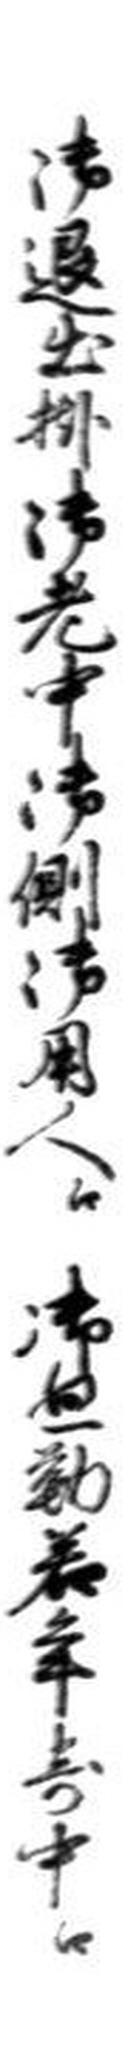御退出掛御老中御側御用人江御廻勤若年寄中江
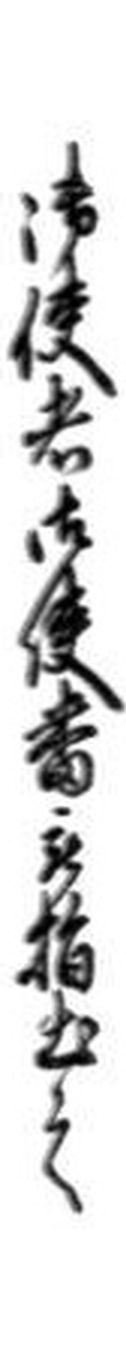御使者御使番被指出之
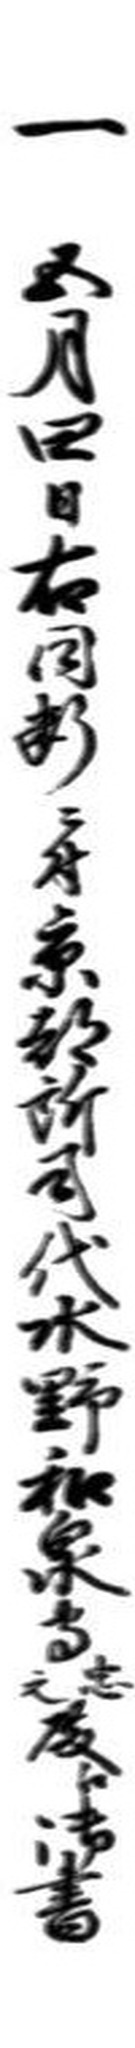一五月四日右同断ニ付京都所司代水野和泉守忠之殿江御書
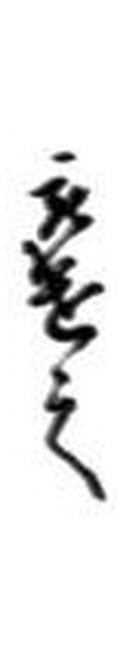被遣之
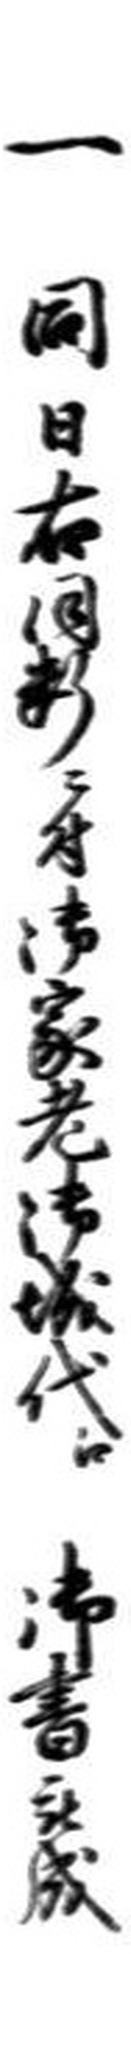一同日右同断ニ付御家老御城代江御書被成
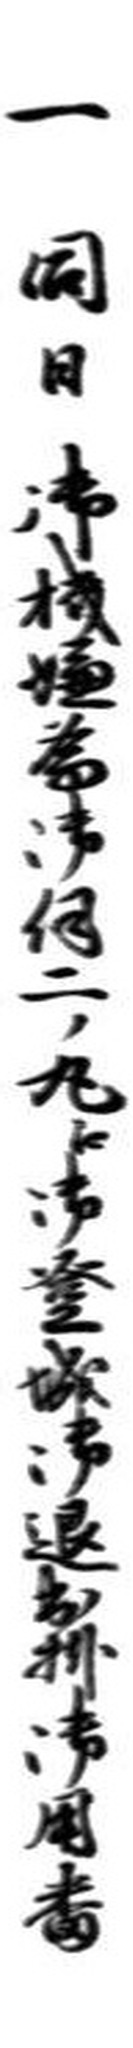一同日御機嫌為御伺二ノ丸江御登城御退出掛御用番
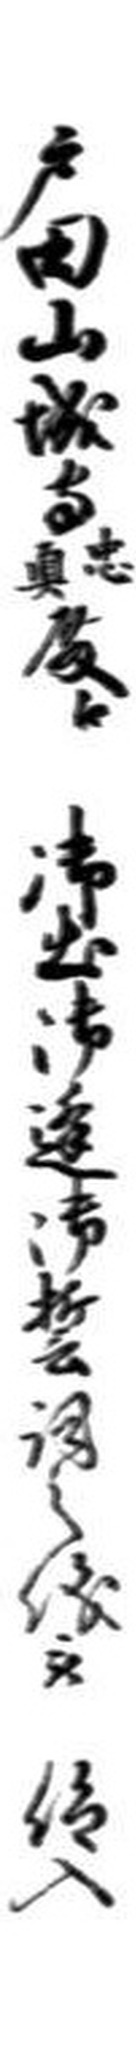戸田山城守忠真殿江御出御達御誓詞之儀被仰入
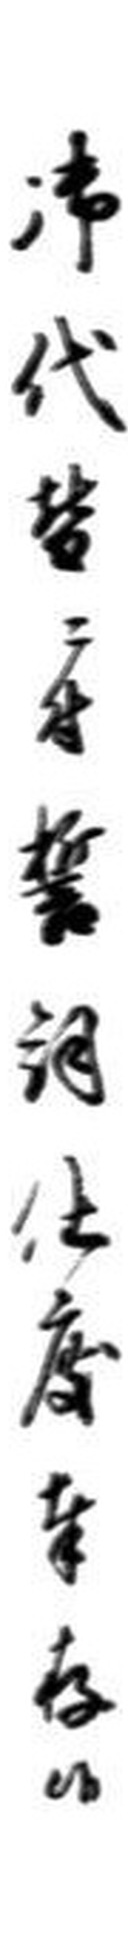御代替ニ付誓詞仕度奉存候
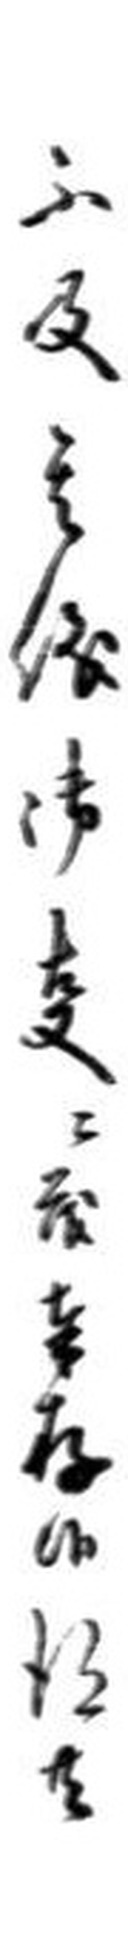不及其儀御事ニも奉存候得共
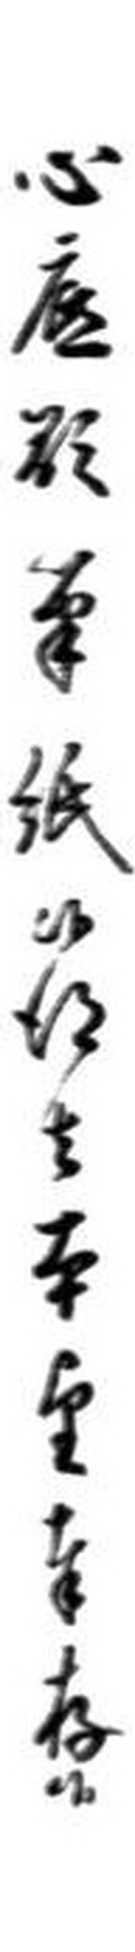心底顕筆紙候得者本望奉存候

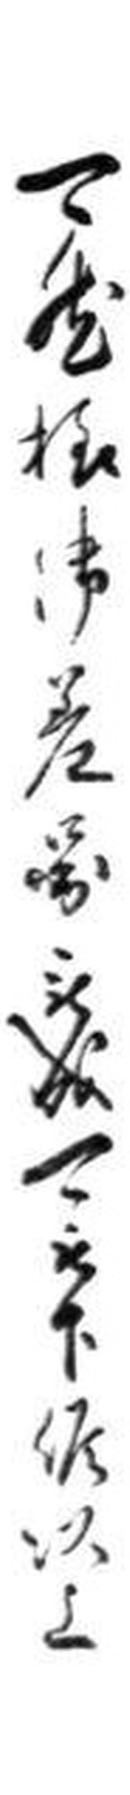可然様御指図被成可被下候以上
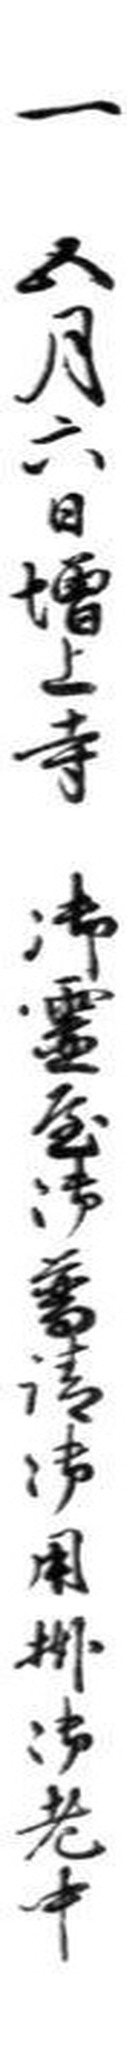一五月六日増上寺御霊屋御普請御用掛御老中
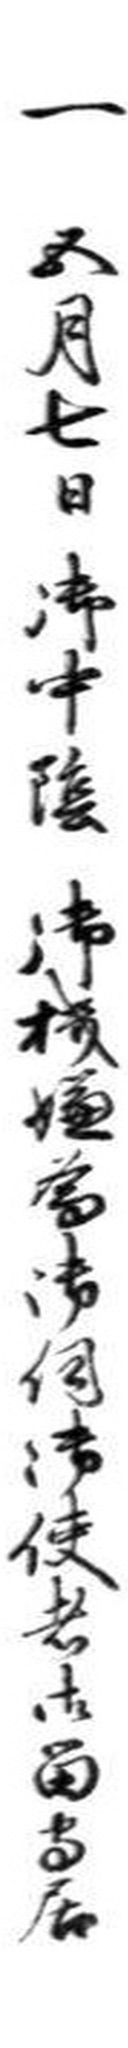一五月七日御中陰御機嫌為御伺御使者御留守居
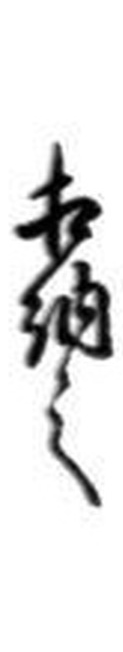相納之
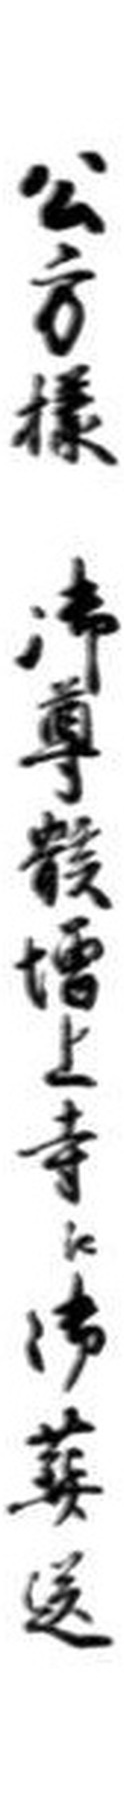公方様御尊骸増上寺江御葬送
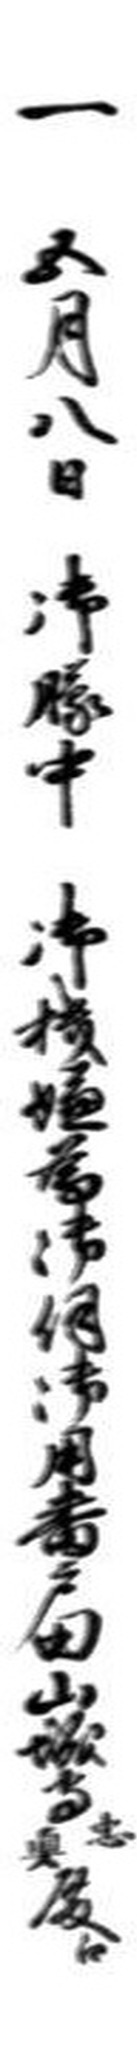一五月八日御朦中御機嫌為御伺御用番戸田山城守忠真殿江
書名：家譜 三十一 吉邦公 享保元年
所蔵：福井県文書館 Fukui Prefectural Archives
